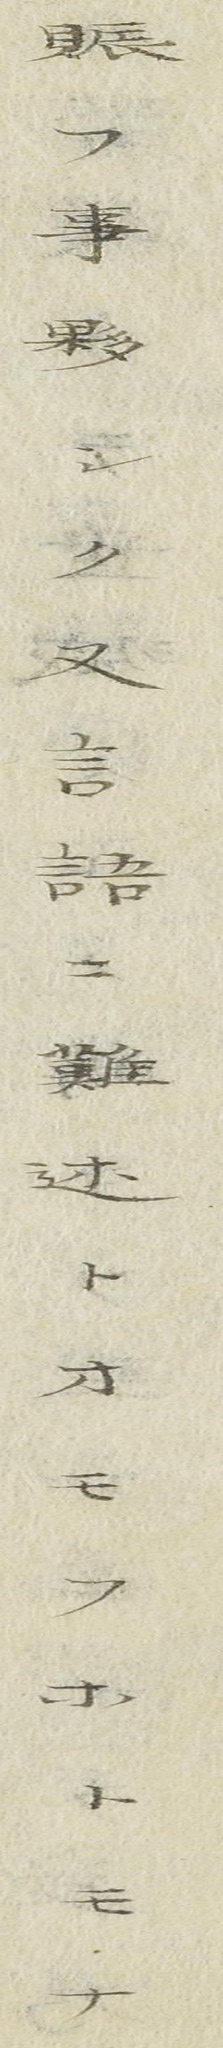賑フ事夥シク又言語ニ難述トオモフホトモナ
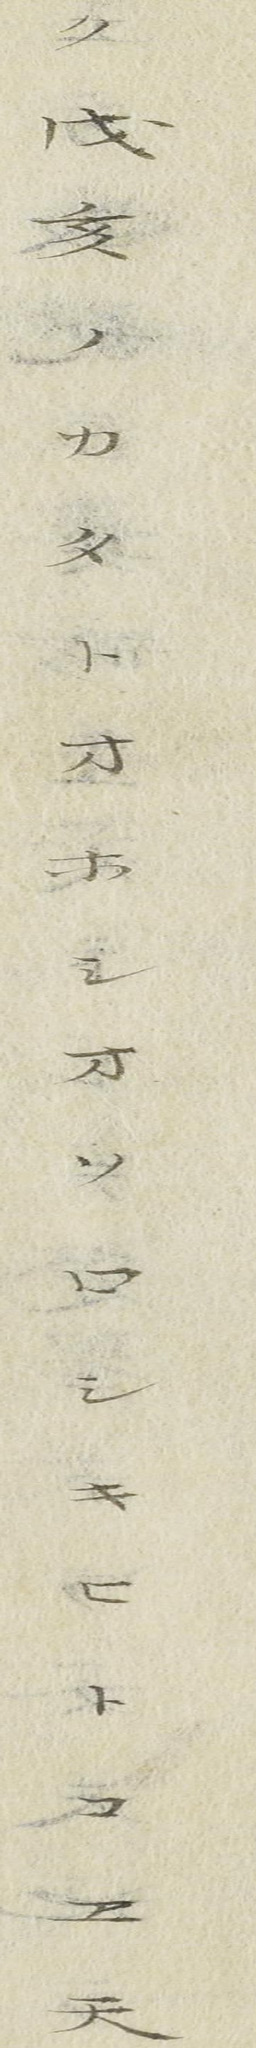ク戌亥ノカタトオホシオソロシキヒトコエ天
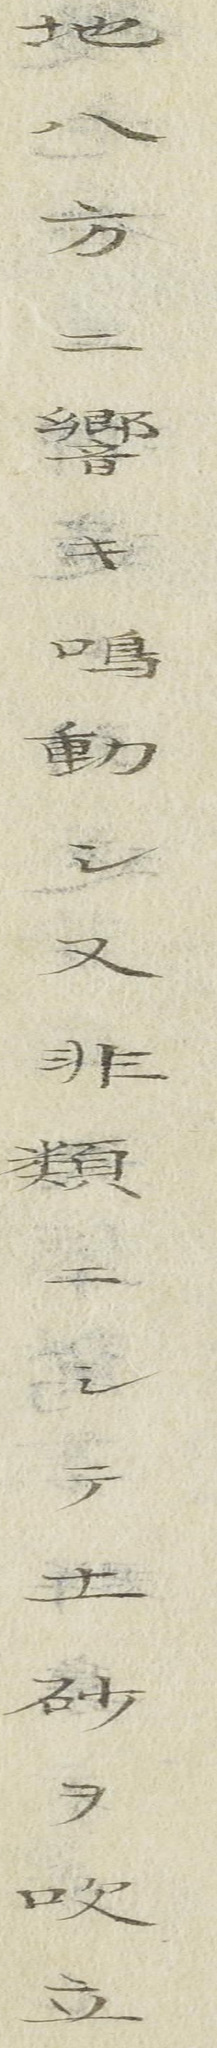地八方ニ響キ鳴動シ又非類ニシテ土砂ヲ吹立
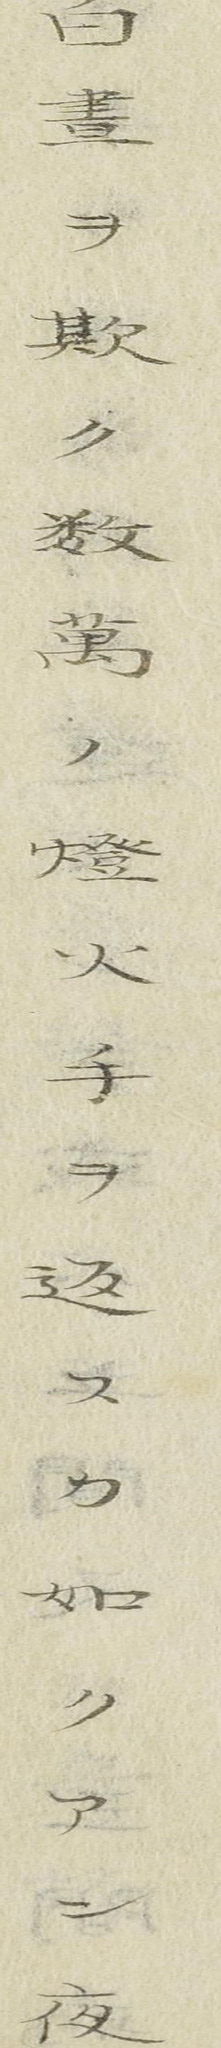白昼ヲ欺ク数万ノ燈火手ヲ返スカ如クアン夜
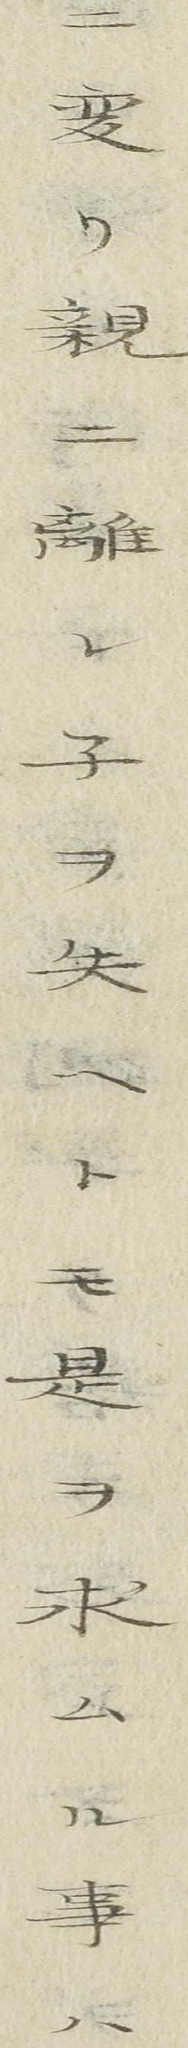ニ変リ親ニ離レ子ヲ失ヘトモ是ヲ求ムル事ハ

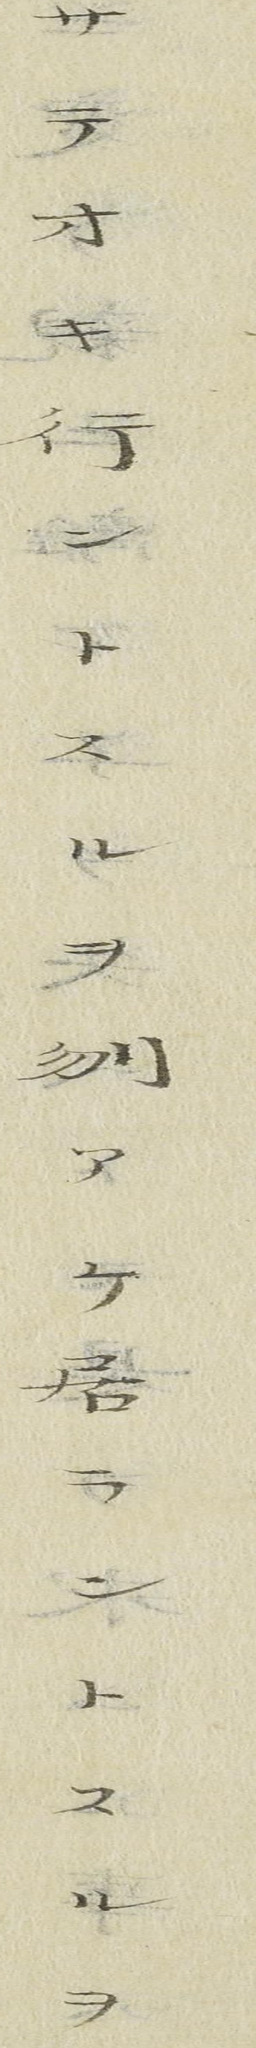サテオキ行ントスルヲ刎アケ居ラントスルヲ
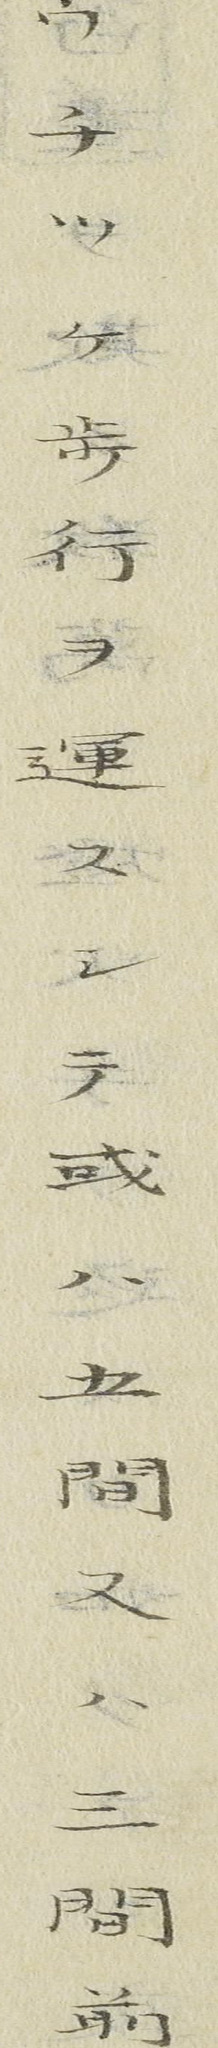ウチツケ歩行ヲ運スシテ或ハ五間又ハ三間前
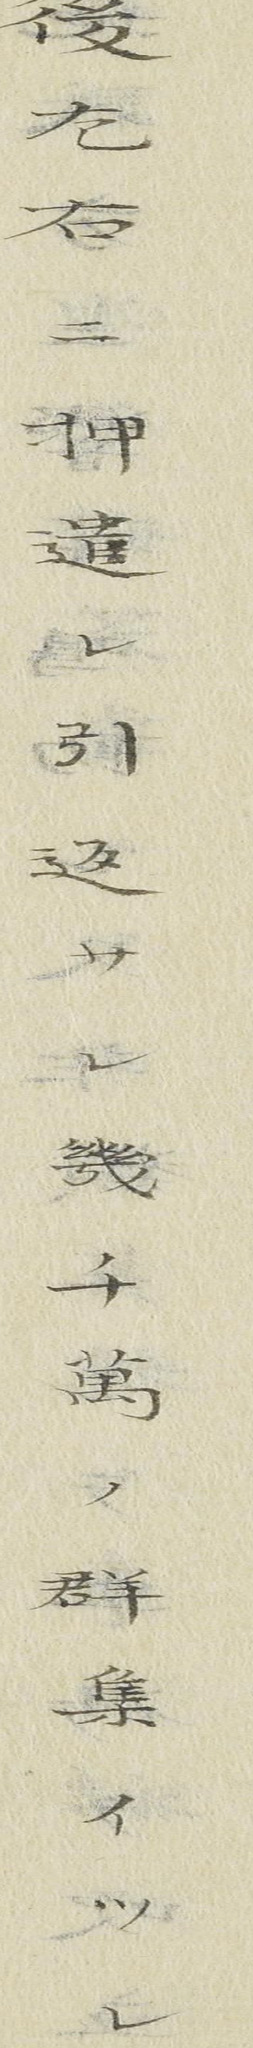後左右ニ押遣レ引返サレ幾千万ノ群集イツレ
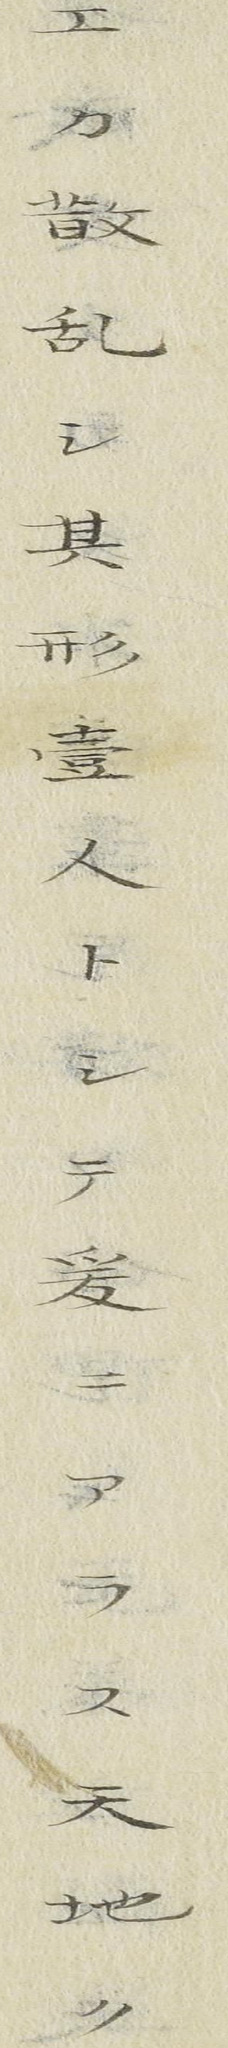エカ散乱シ其形壱人トシテ爰ニアラス天地ク
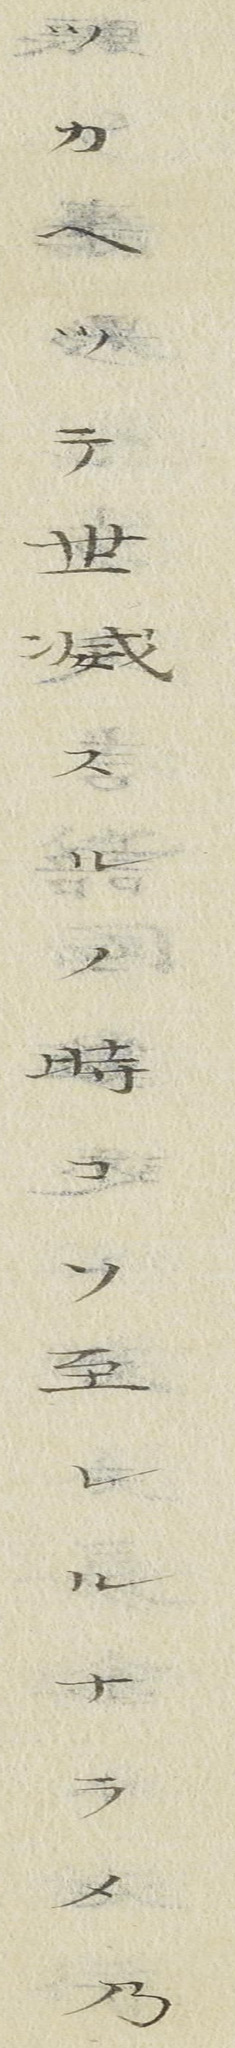ツカヘツテ世減スルノ時コソ至レルナラメ乃
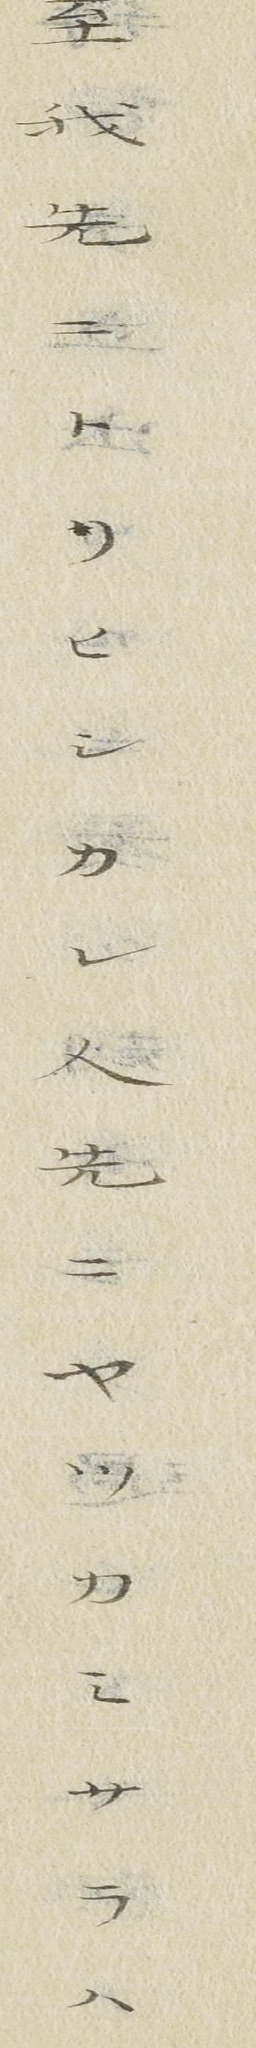至我先ニトリヒシカレ人先ニヤツカミサラハ
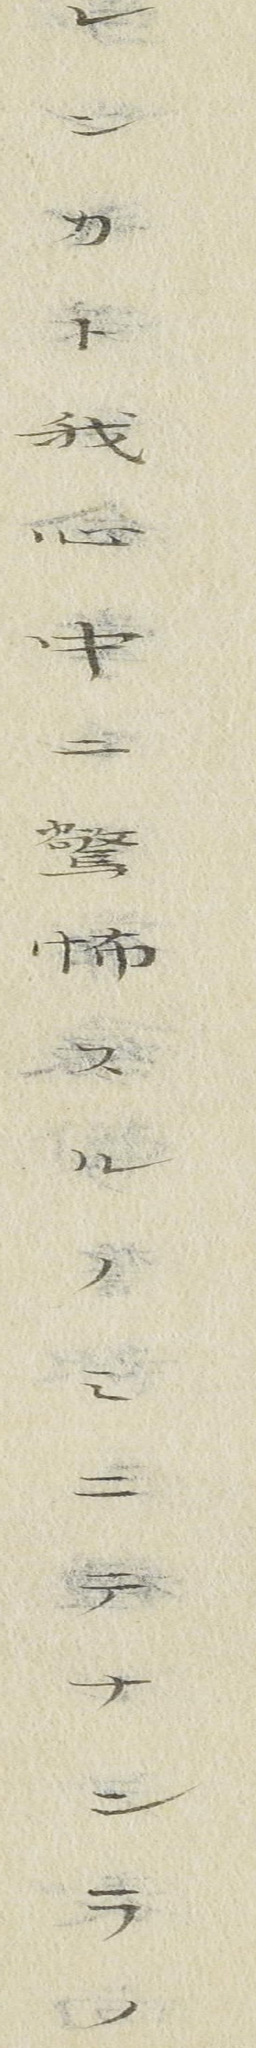レンカト我心中ニ驚怖スルノミニテナンラノ
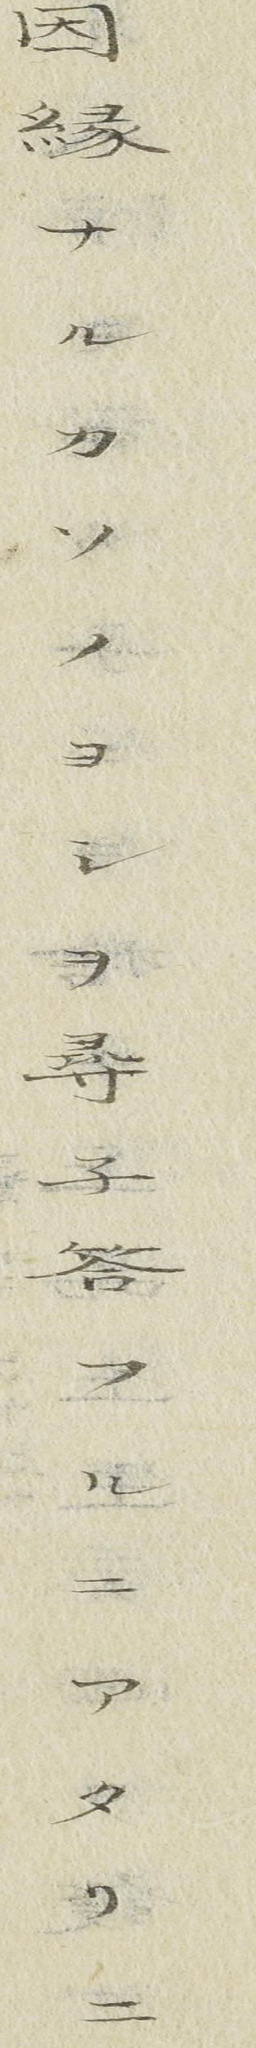因縁ナルカソノヨシヲ尋子答フルニアタリニ
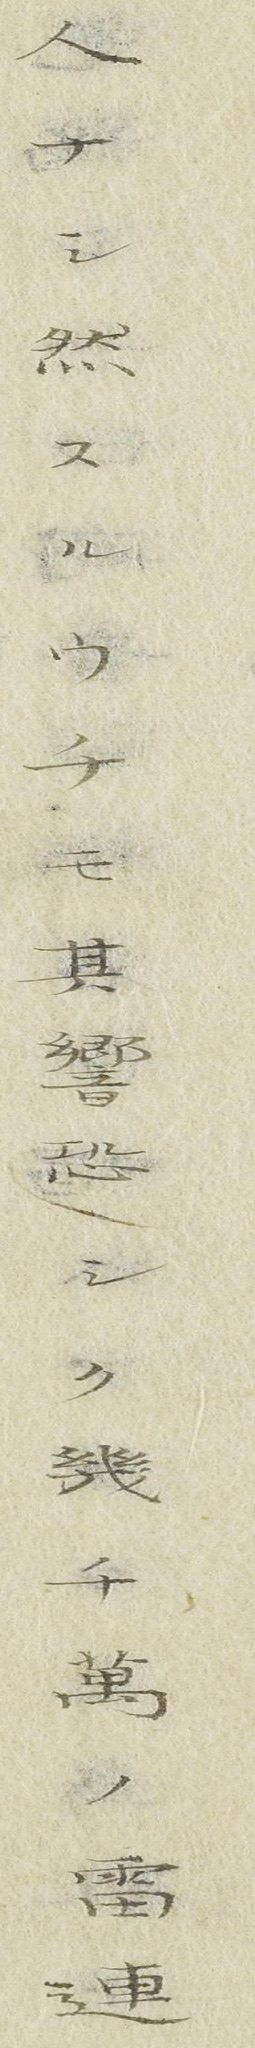人ナシ然スルウチモ其響恐シク幾千万ノ雷連
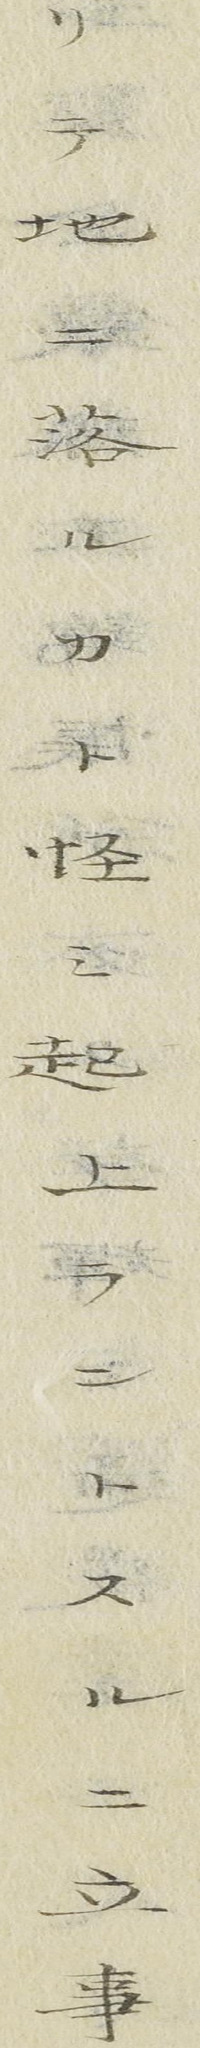リテ地ニ落ルカト怪ミ起上ラントスルニ立事
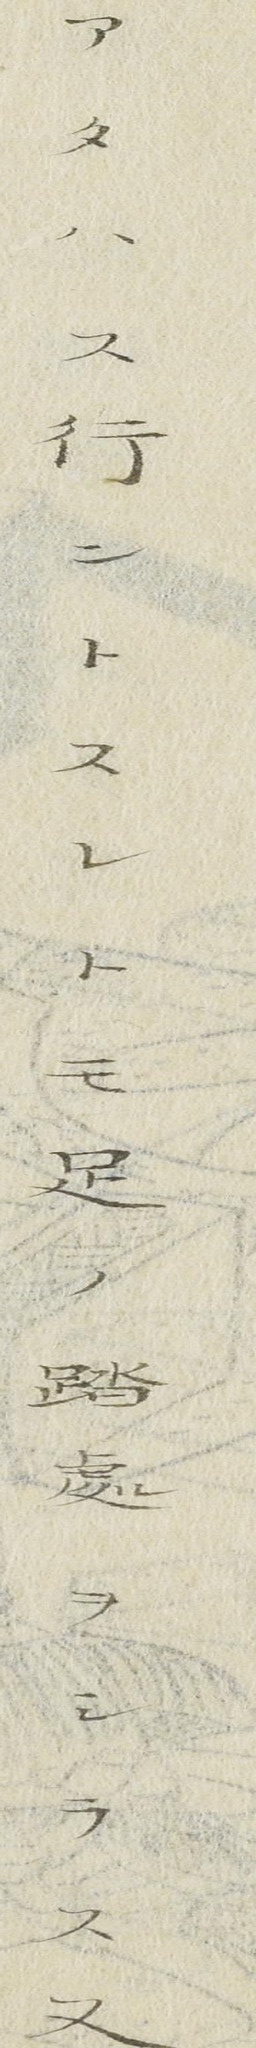アタハス行ントスレトモ足ノ踏処ヲシラス又
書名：地災撮要　地震之部　巻ノ二
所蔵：東京大学地震研究所図書室 Earthquake Research Institute Library, The University of Tokyo, JAPAN
